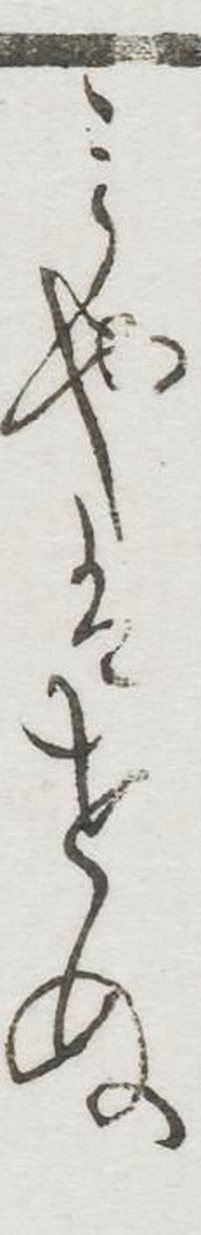みやはせぬ
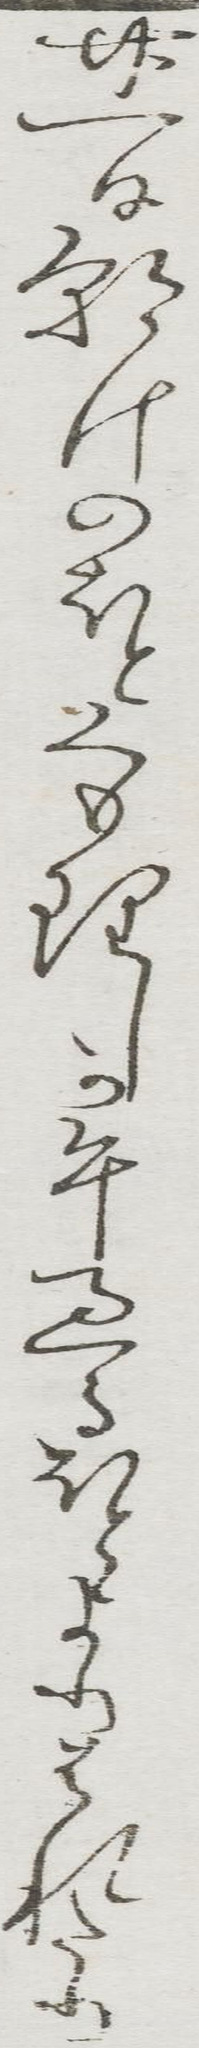廿一日朝けのほとくもりしか午過るほとよりはれたり
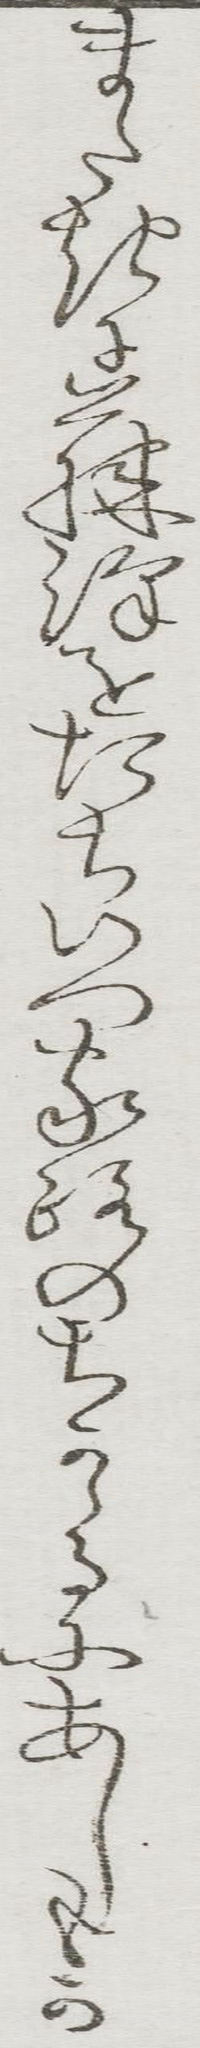またきに藤沢をたちいつ家路のちかゝるにあしもか
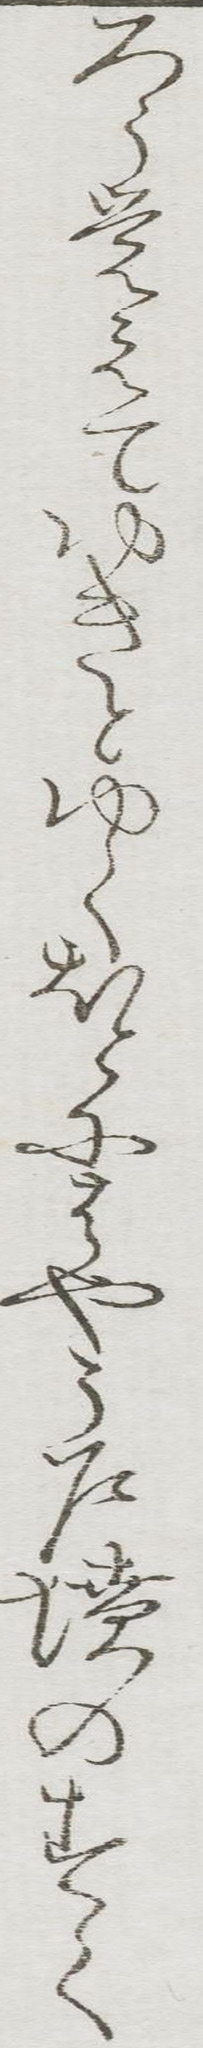ろう覚えてゆきとゆくほとにはやう戸墳のすく
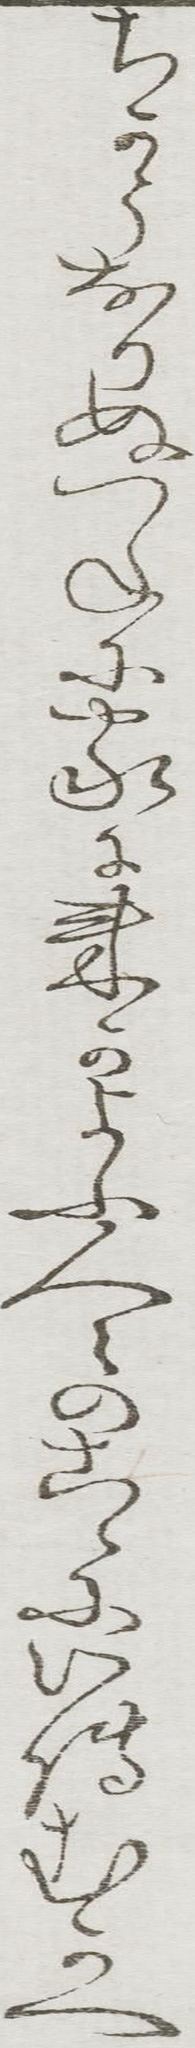ちかうなりぬつねに家に来かよふ人々のこゝにいてむかへ
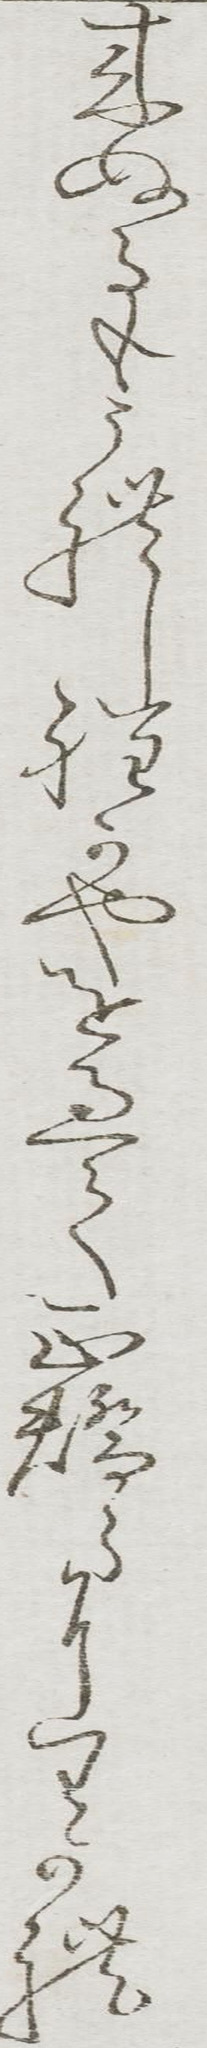来ぬるもうれし程かやを過て正矯らにわかれ
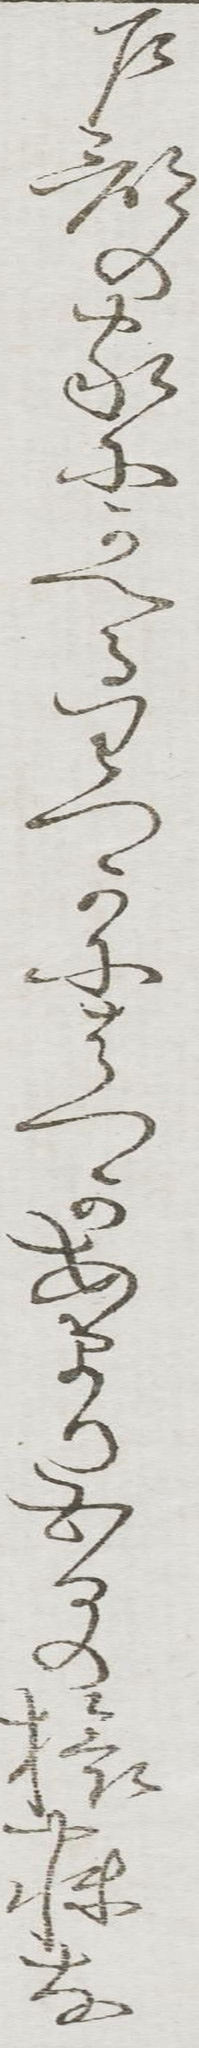戸部の家にかへるわつかにはつかあまり五日の旅寝な
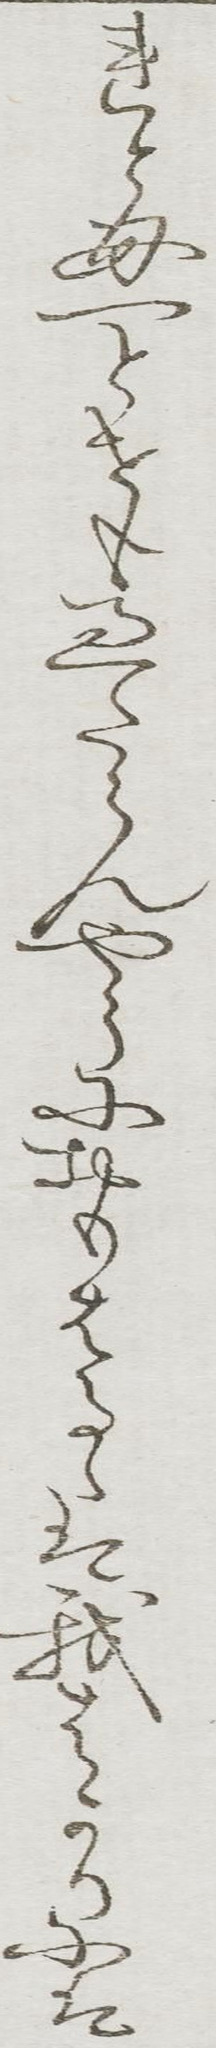れとも一とせも過たらんやうにおもはるゝは我はかりには

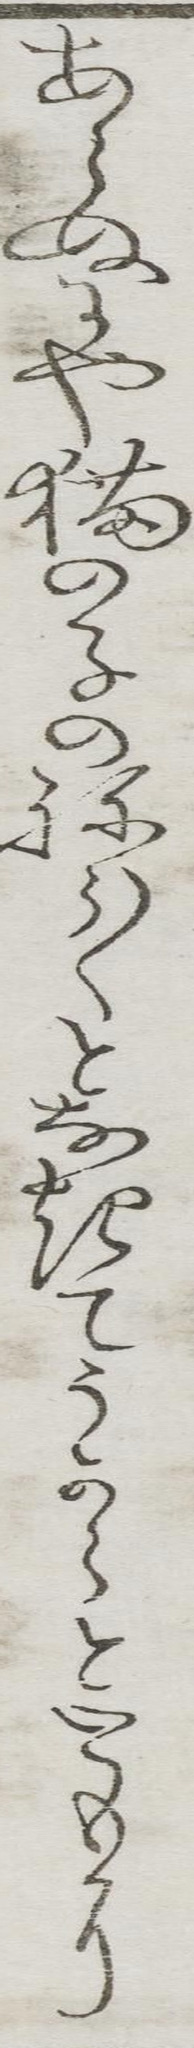あらぬにや猫の子のねう〳〵となきてうからとともに
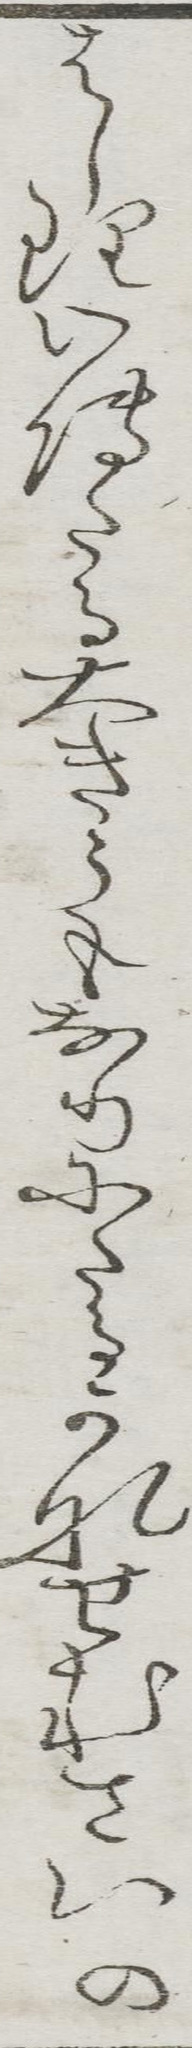はしりいてたる大きうもなりにたるかなせむさいの
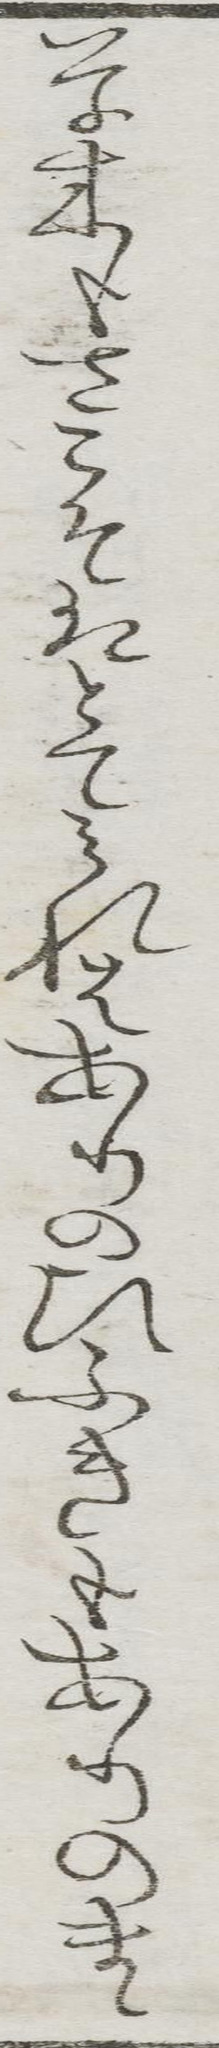草木もさこそはとてみれはありのひふきもありのまゝ
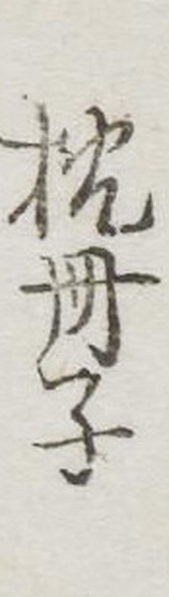枕冊子
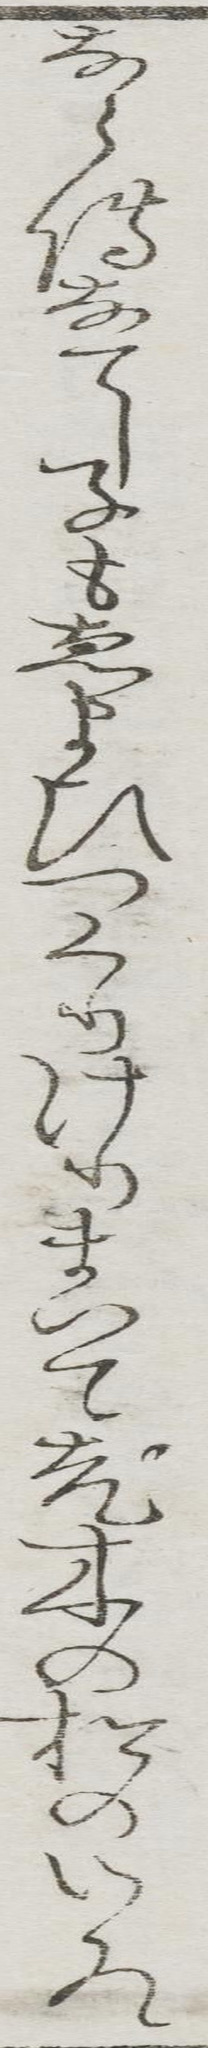ならてなてし子もゑまひつくりけりまいて老木の松のいろ
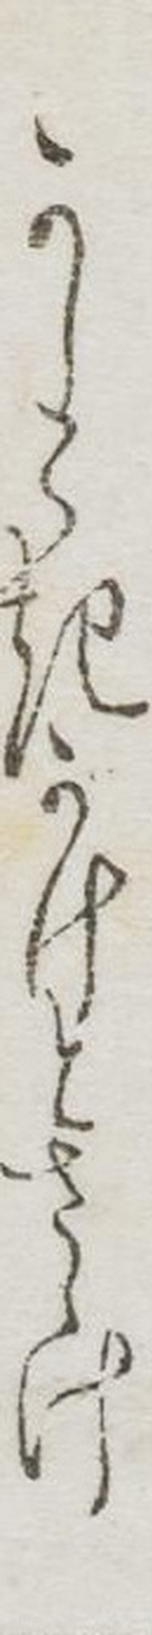かしこきかけとさゝけ
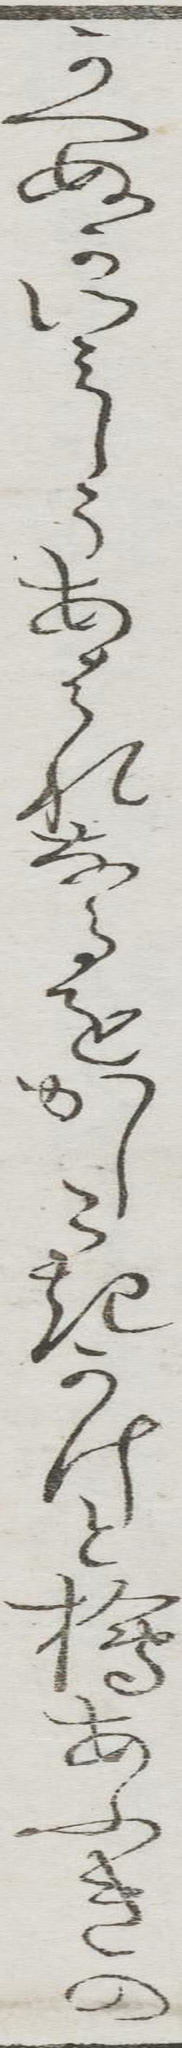かへぬかいみしうあはれなるをかしこきかけと檜あふきの
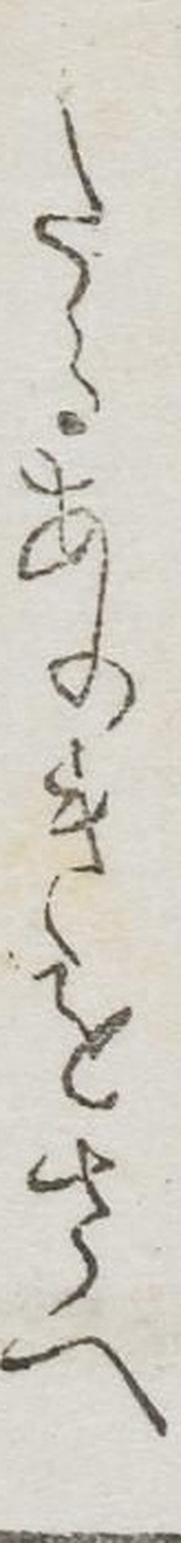たるあふきをさへ
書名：挿画熱海日記　全
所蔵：東京大学地震研究所図書室 Earthquake Research Institute Library, The University of Tokyo, JAPAN
